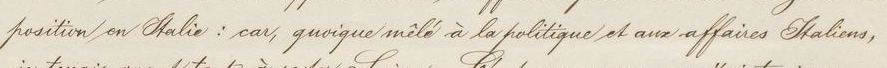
position en Italie: car, quoique mêlé à la politique et aux affaires Italiens,
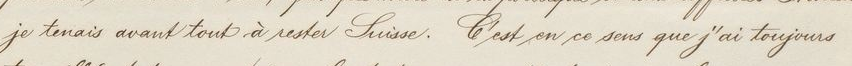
je tenais avant tout à rester Suisse. C'est en ce sens que j'ai toujours
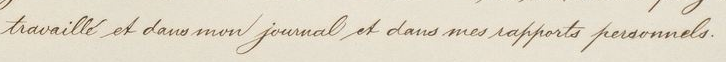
travaillé et dans mon journal et dans mes rapports personnels.
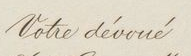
Votre dévoué
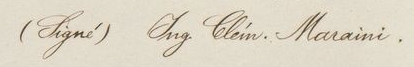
(Signé) Ing. Clém. Maraini.
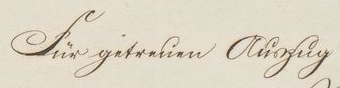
Für getreuen Auszug
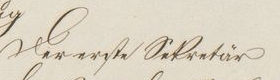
Der erste Sekretär
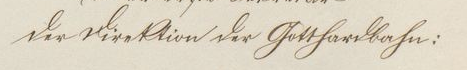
der Direktion der Gotthardbahn
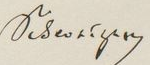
Schweizer
